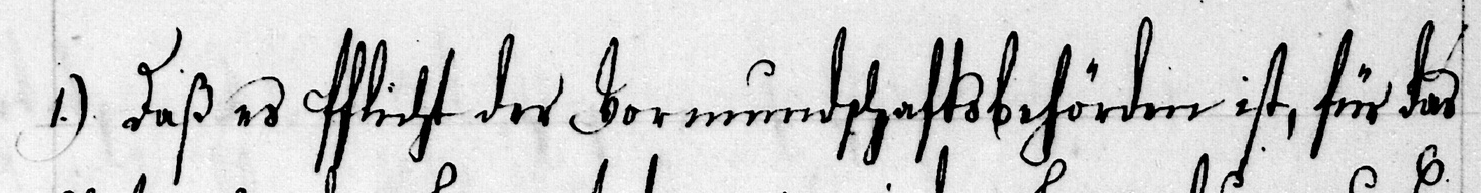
1.) Daß es Pflicht der Vormundschaftsbehörden ist, für
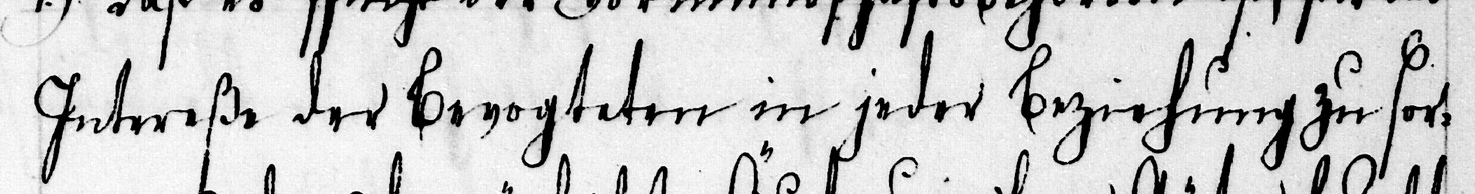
Intereße der Bevogteten in jeder Beziehung zu sor¬
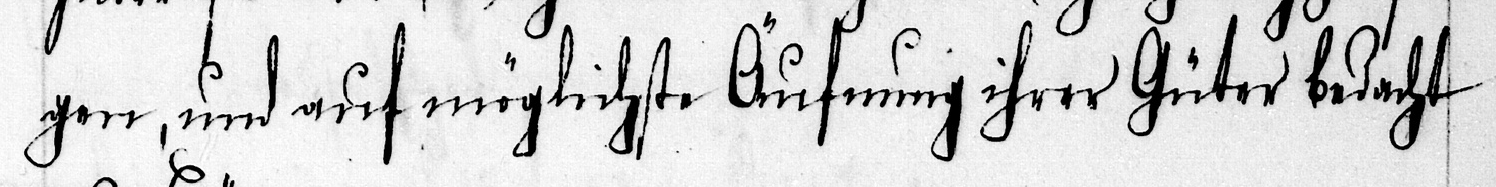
gen, und auf möglichste Äufnung ihrer Güter bedacht
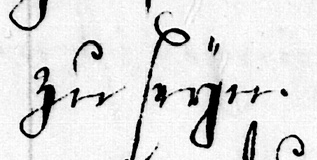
zu seyn.
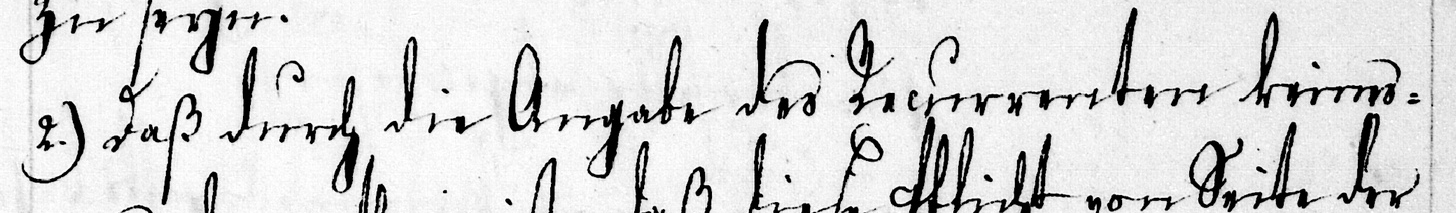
2.) Daß durch die Angabe des Recurrenten keines¬
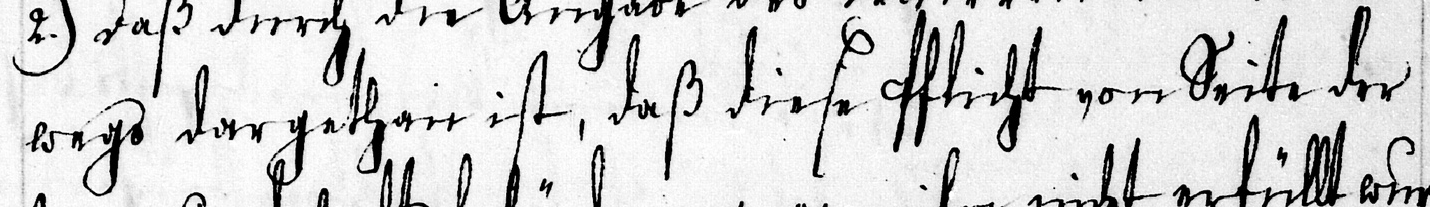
wegs dargethan ist, daß diese Pflicht von Seite der
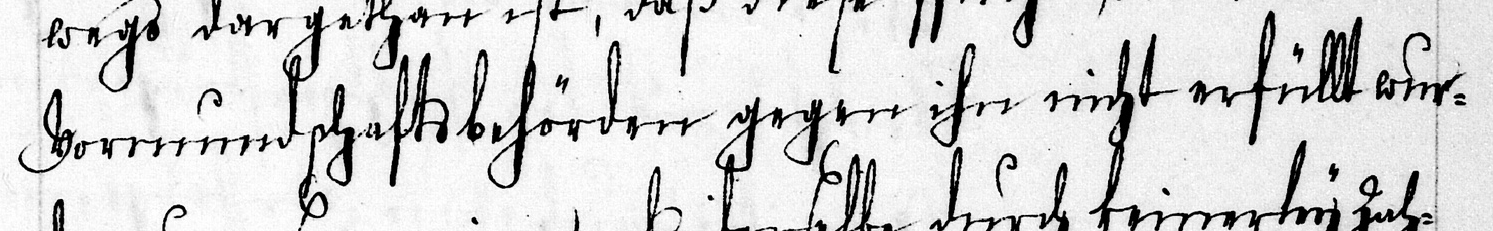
Vormundschaftsbehörden gegen ihn nicht erfüllt wur¬
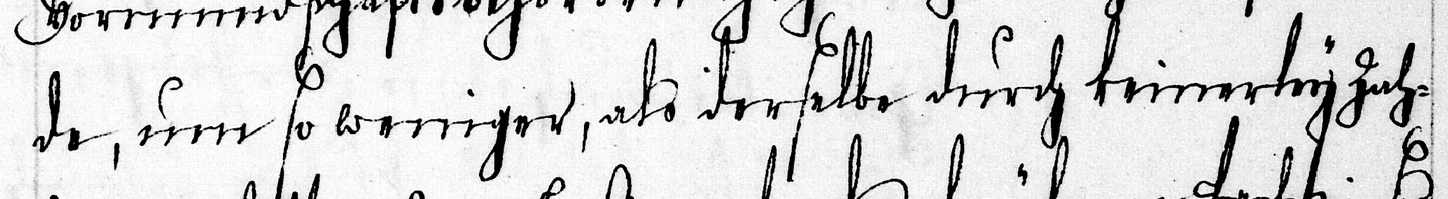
de, um so weniger, als derselbe durch keinerley Zah¬
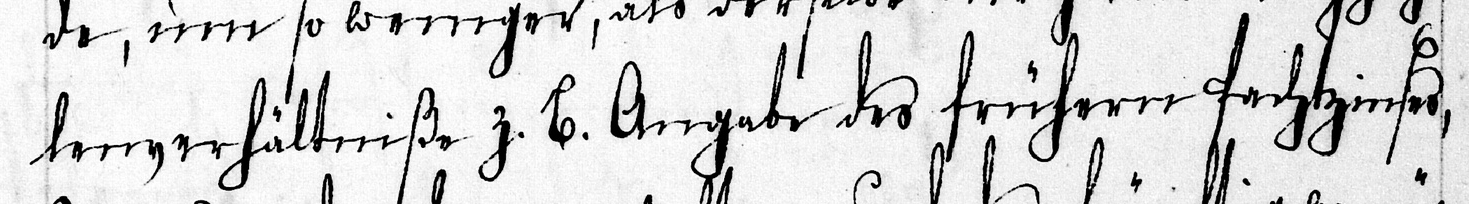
lenverhältniße z. B. Angabe des frühern Pachtzinses,
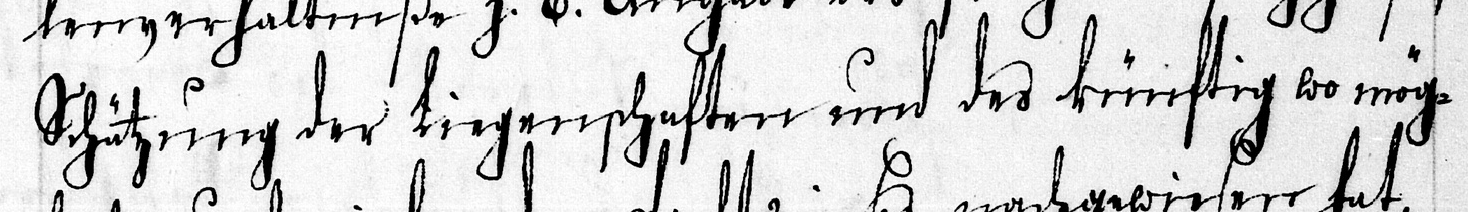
Schätzung der Liegenschaften und des künftig wo mög¬
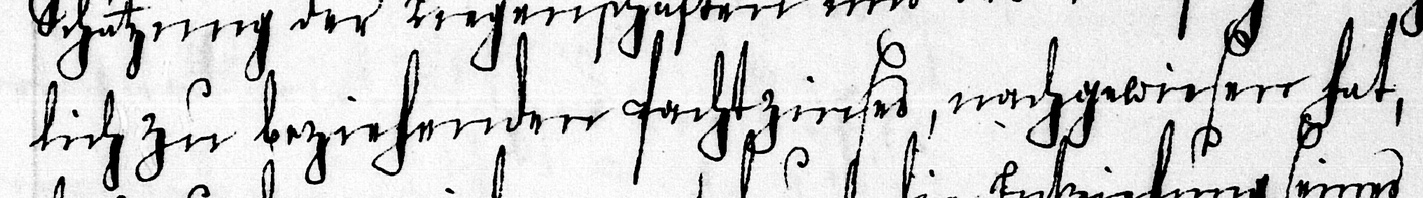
lich zu beziehenden Pachtzinses, nachgewiesen hat,
